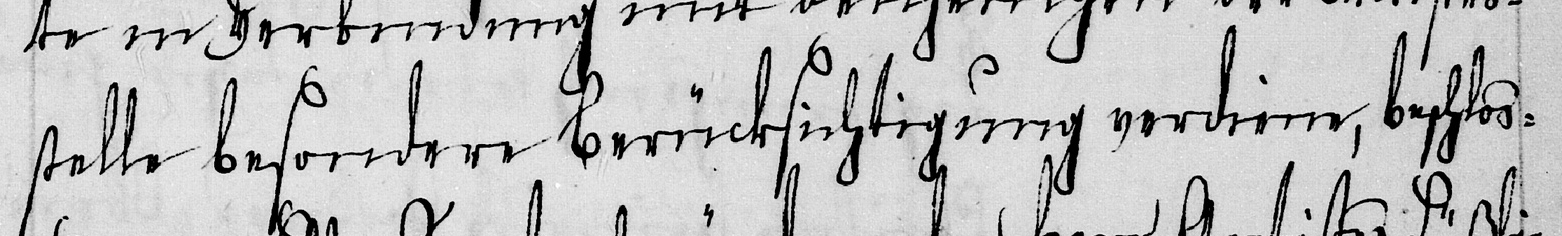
telle besondere Berücksichtung verdiene, beschlo¬
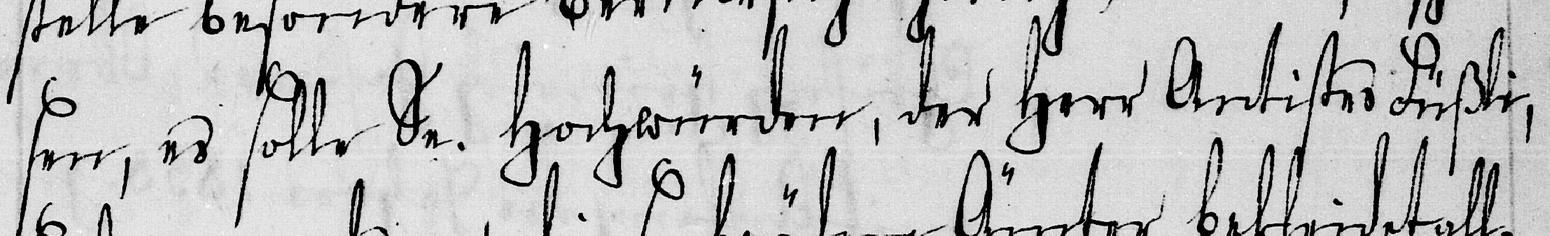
ßen, es solle Se. Hochwürden, der Herr Antistes Füßli,
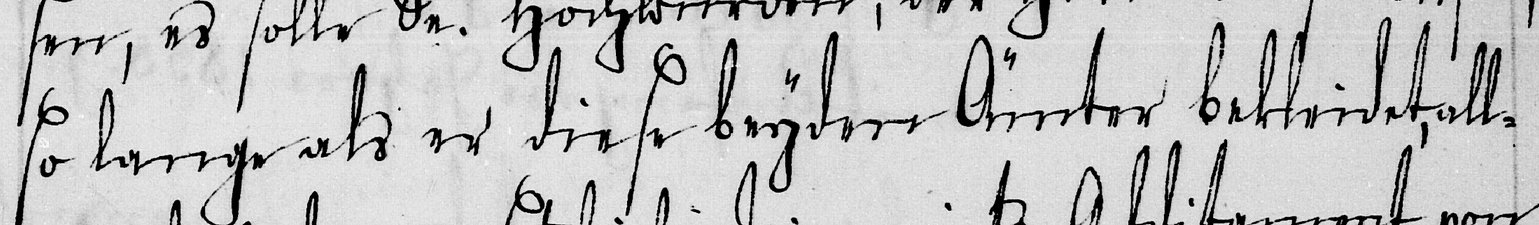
so lange als er diese beyden Ämter bekleidet, al¬
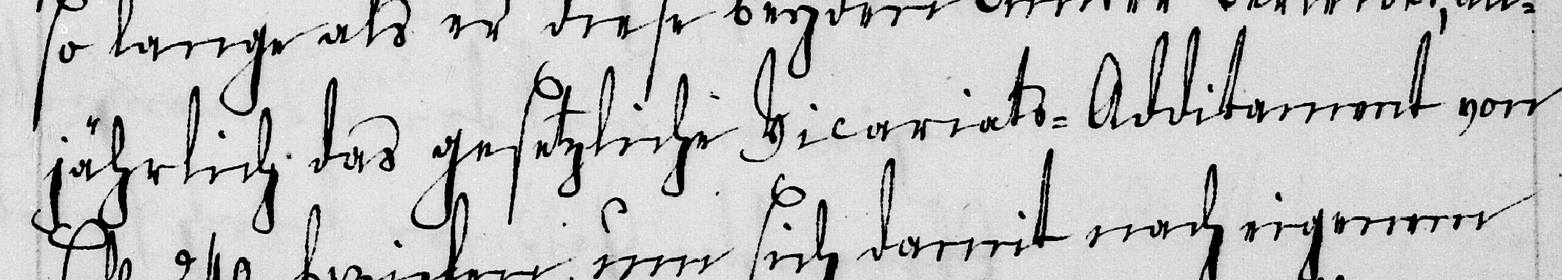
ljährlich das gesetzliche Vicariats-Additament von
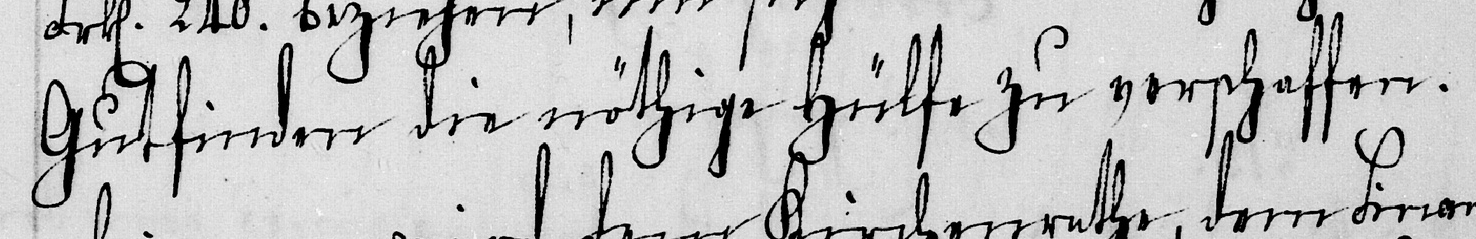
Gutfinden die nöthige Hülfe zu verschaffen.
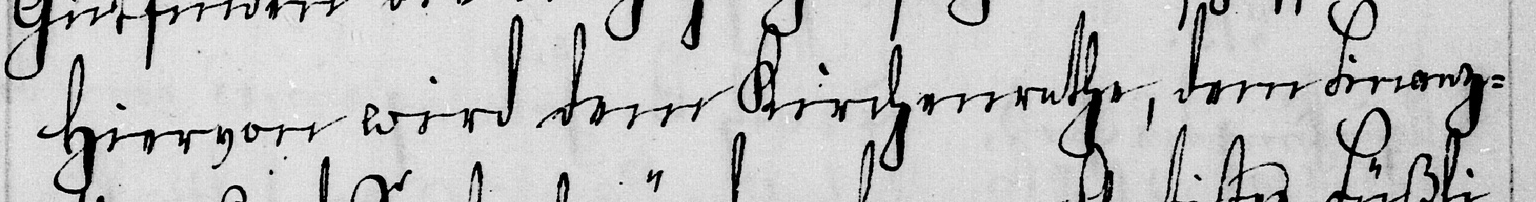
Hiervon wird dem Kirchenrathe, dem Finanz¬
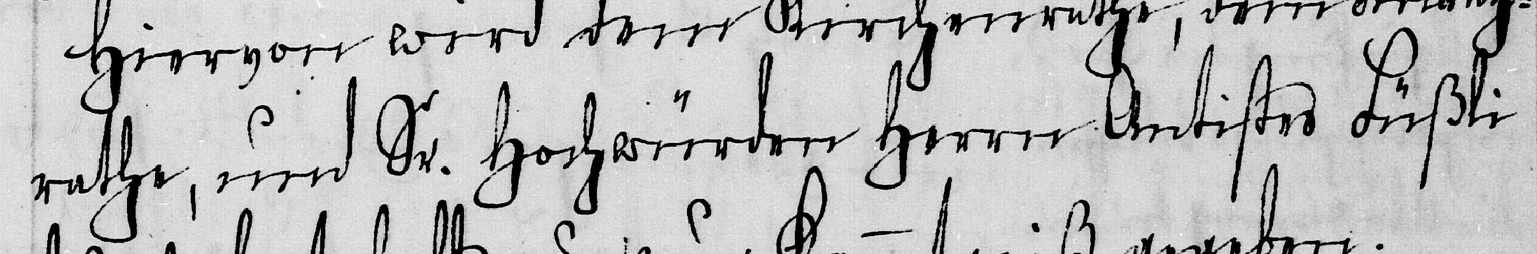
rathe, und Se. Hochwürden Herrn Antistes Füßli
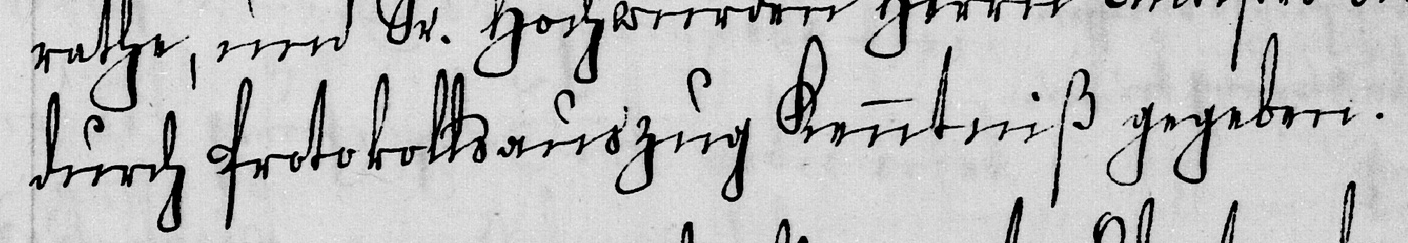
durch Protokollsauszug Kenntniß gegeben.
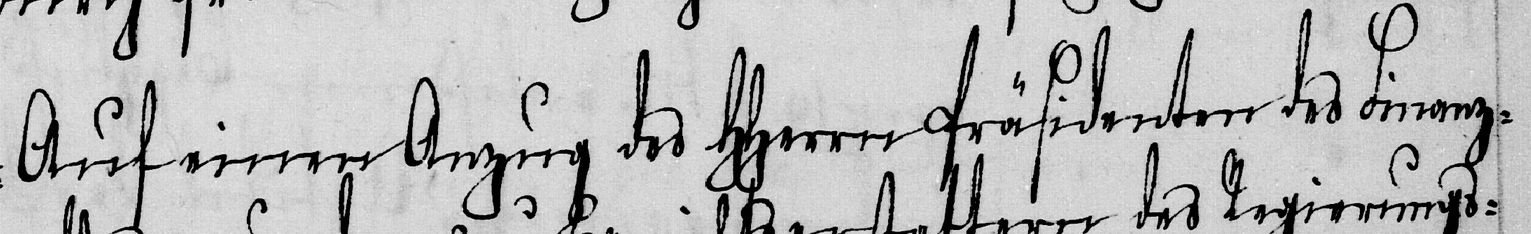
Auf einen Anzug des HHerrn Präsidenten des Finan¬
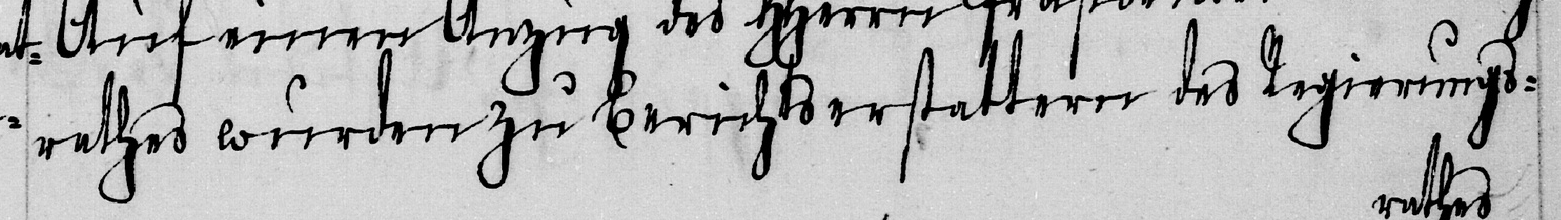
zrathes wurden zu Berichterstattern des Regierungs-
